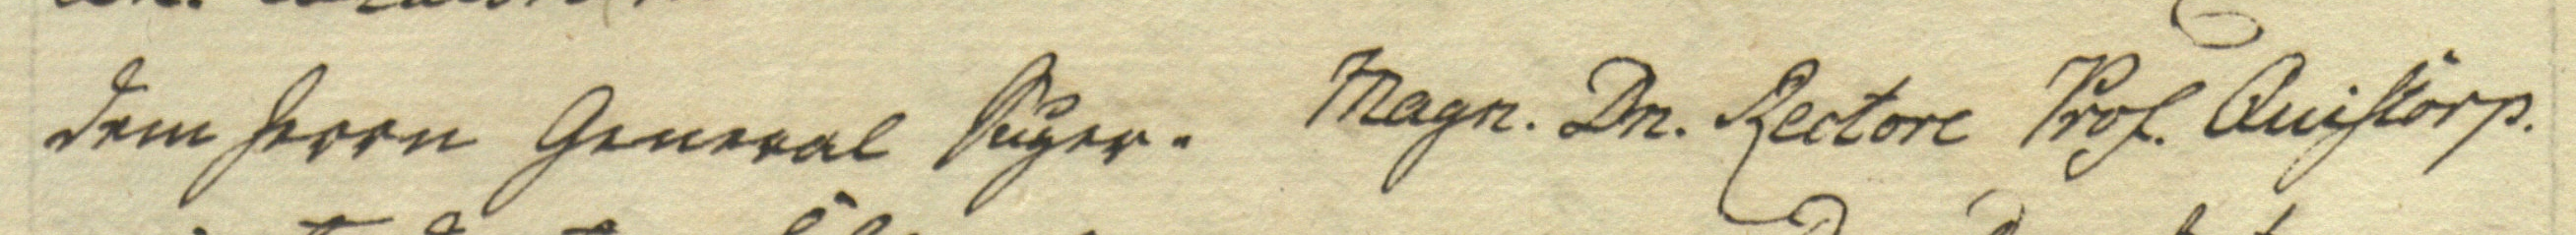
dem Herrn General Super¬ Magn. Dn. Rectore Prof. Quistorp.
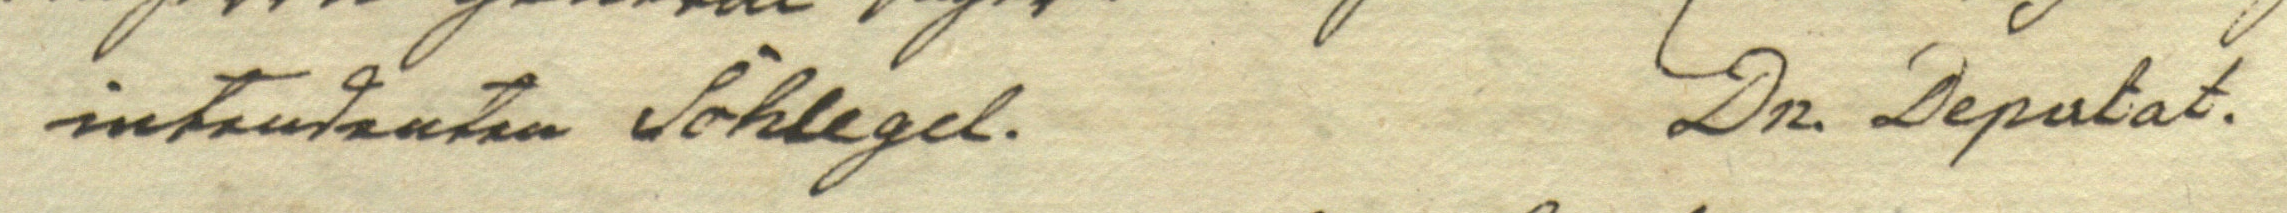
intendenten Schlegel. Dn. Deputat.
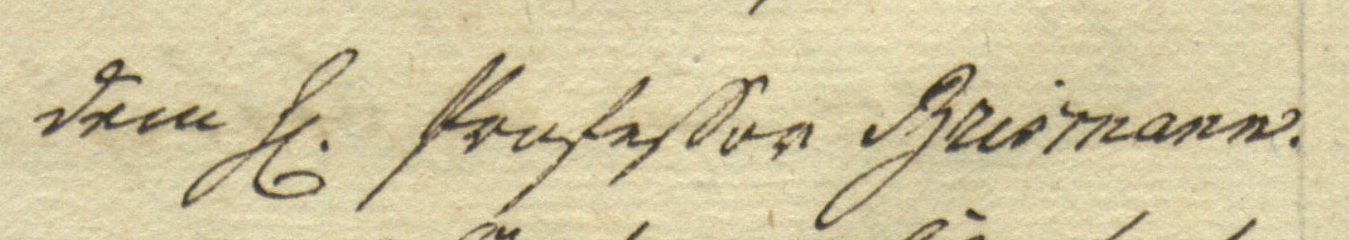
dem H. Professor Brismann.
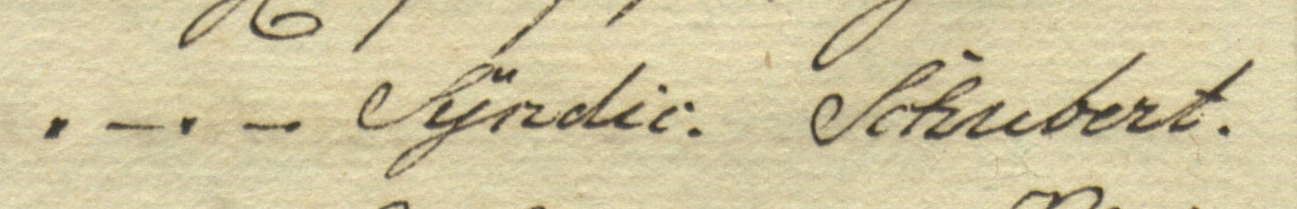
Sÿndic. Schubert.
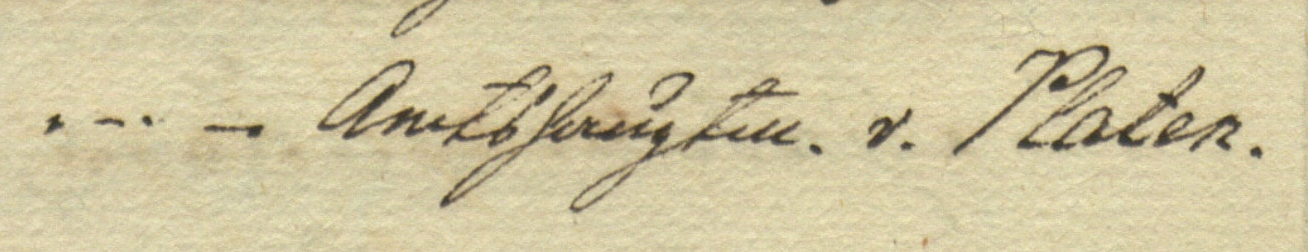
Amtshauptm. v. Platen.
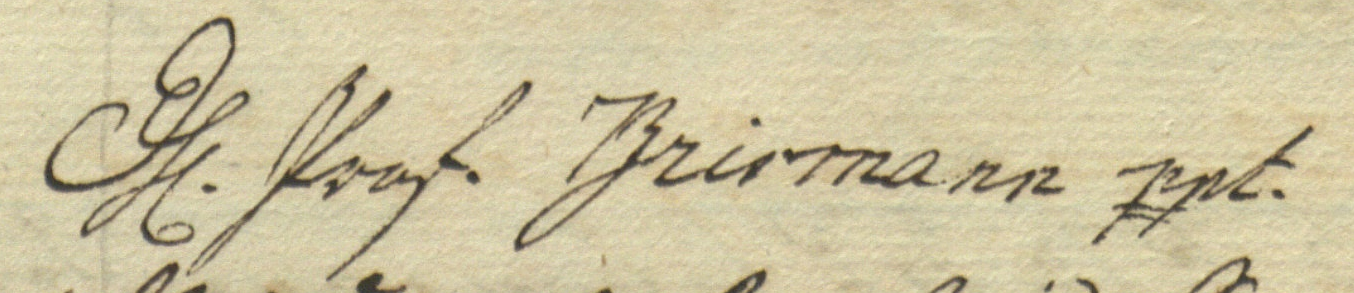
dh. Prof. Brismann ppt.
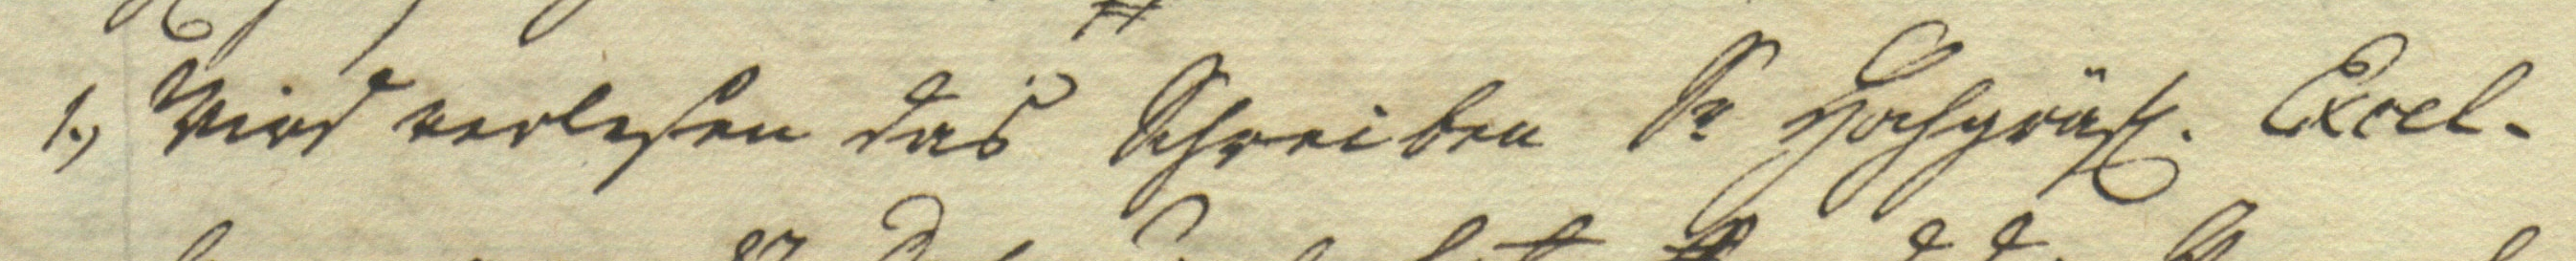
1., Wird verlesen das Schreiben Sr Hochgräfl. Excel¬
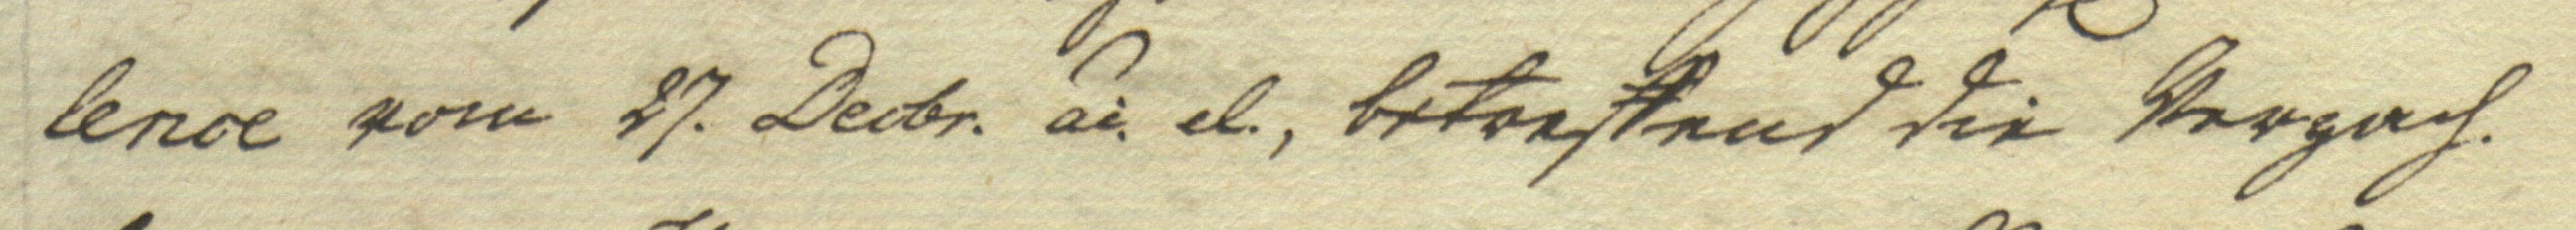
ence vom 27. Decbr. ai. el., betreffend die Verpach¬
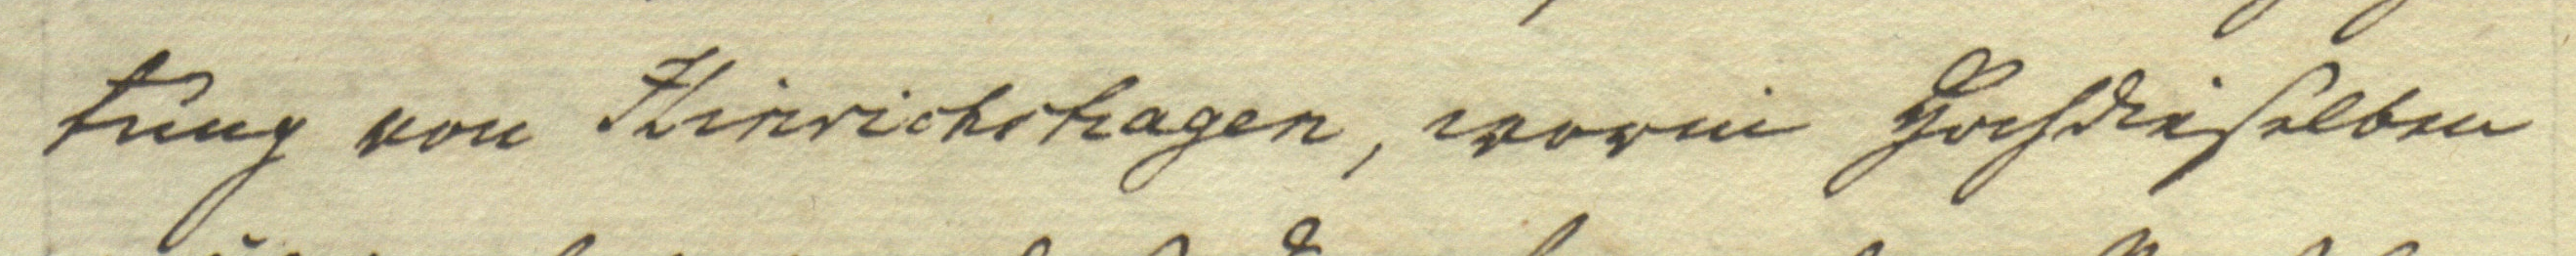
tung von Hinrichshagen, worin Hochdieselben
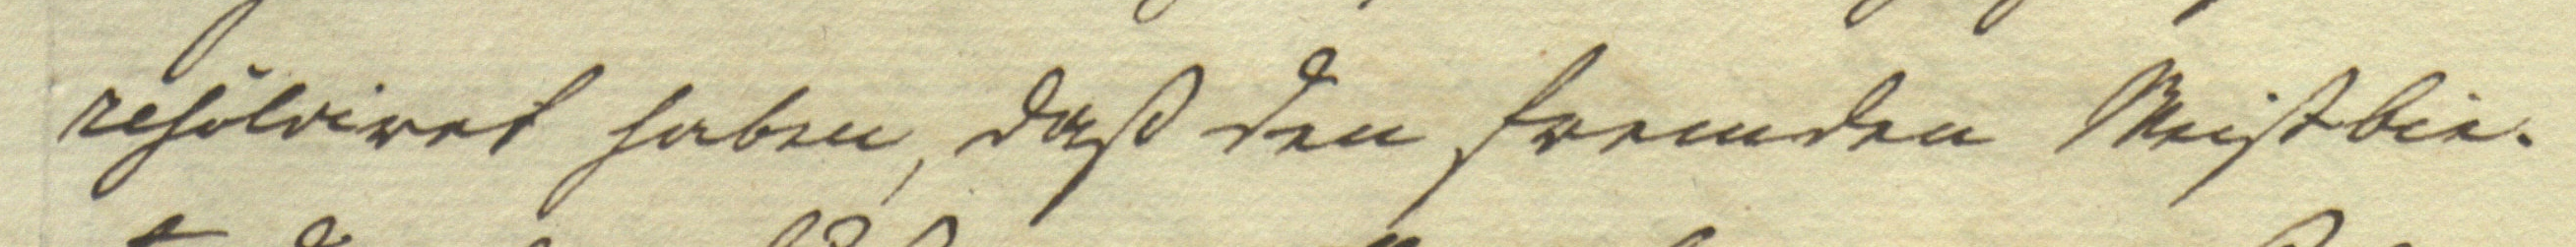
resolviret haben, daß den fremden Meistbie¬
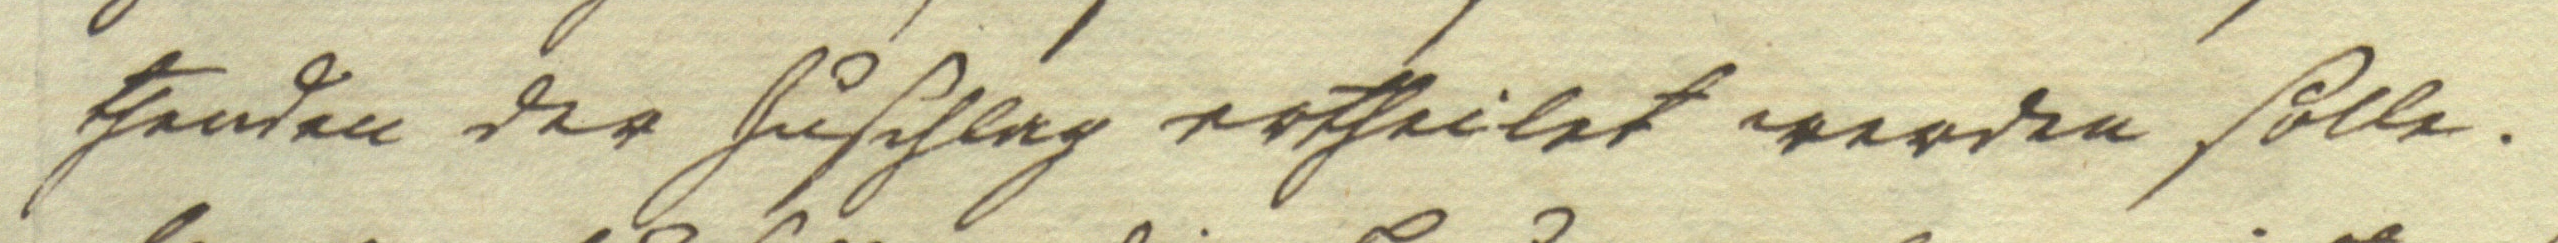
thenden der Zuschlag ertheilet werden solle.
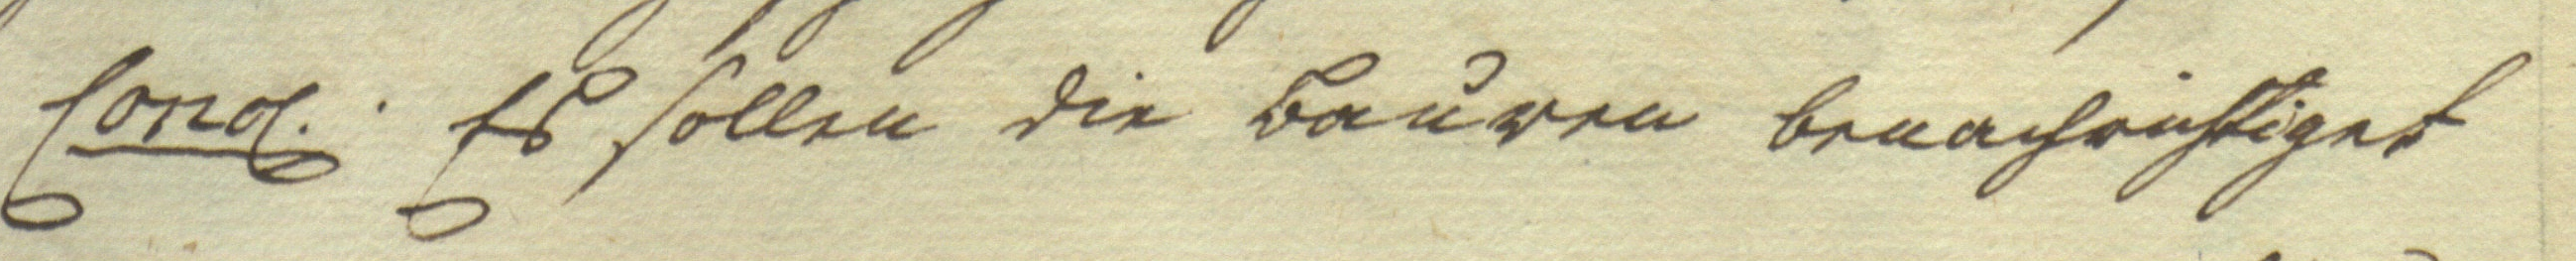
Concl. Es sollen die Bauren benachrichtiget
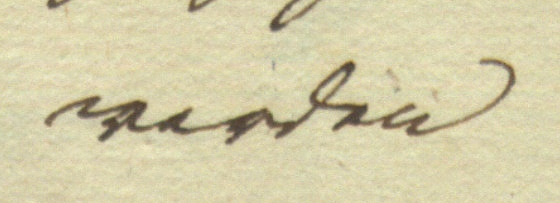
werden
